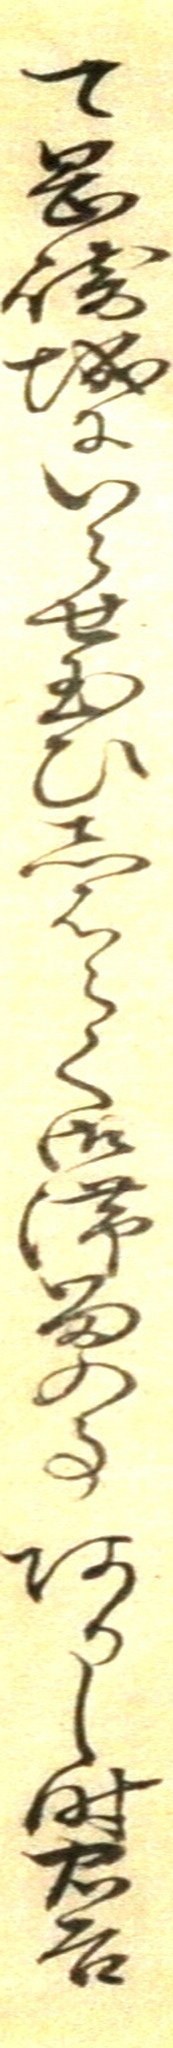て岡崎城にいらせ玉ひしはらく御滞留の事ありし時忠吉
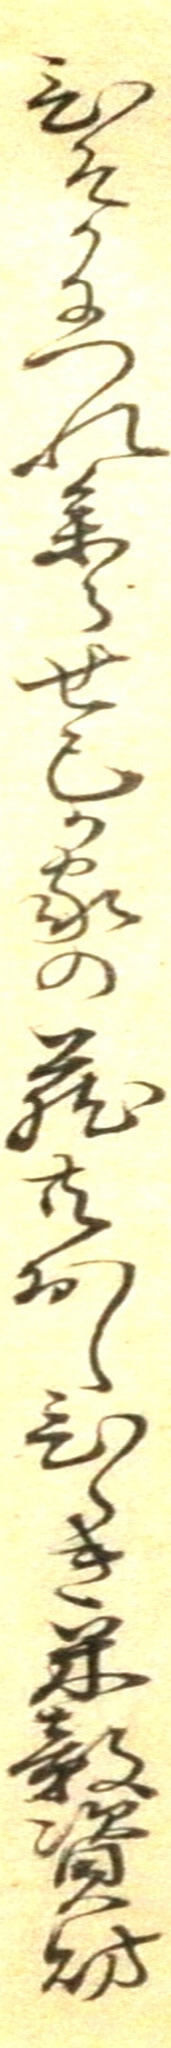ひそかにつれ参らせ己か家の蔵共おしひらき米穀資財
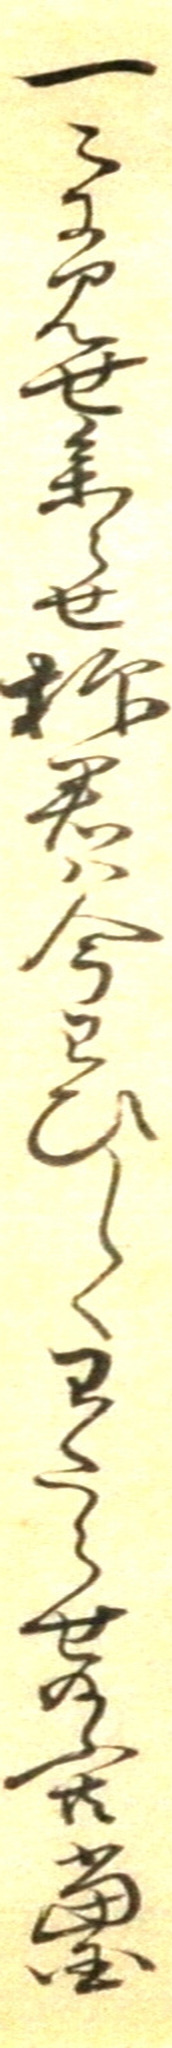一々に見せ参らせ抑君は今わひしくわたらせ給ふ共当国
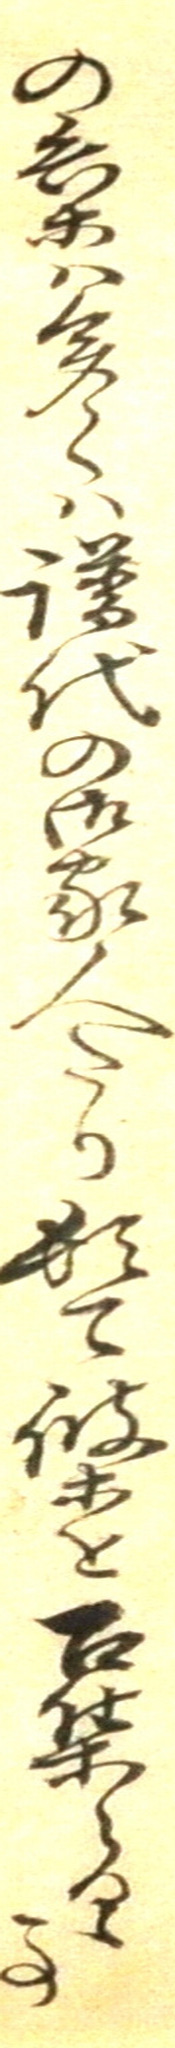の兵等は多くは譜代の御家人たり頓て彼等を召集らるゝ事
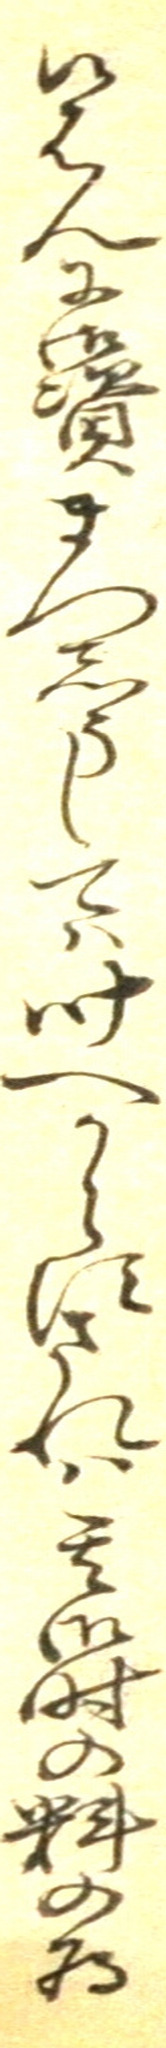候はんに御資まつしうしては叶へからすされは其御時の料の為
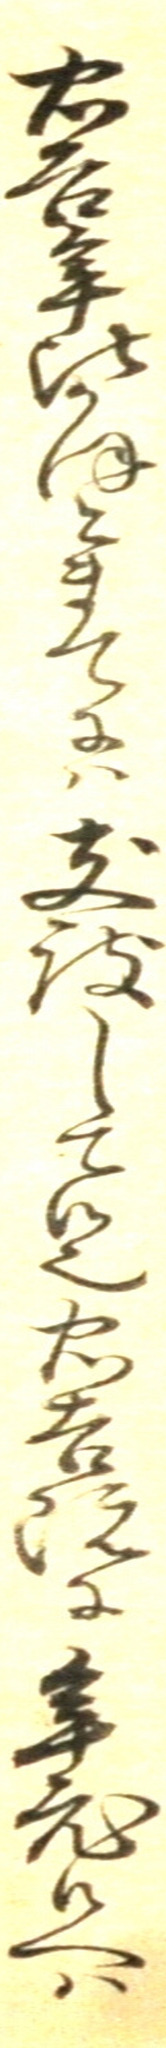忠吉年比かほとまてには支度して候也忠吉既に年老候へは
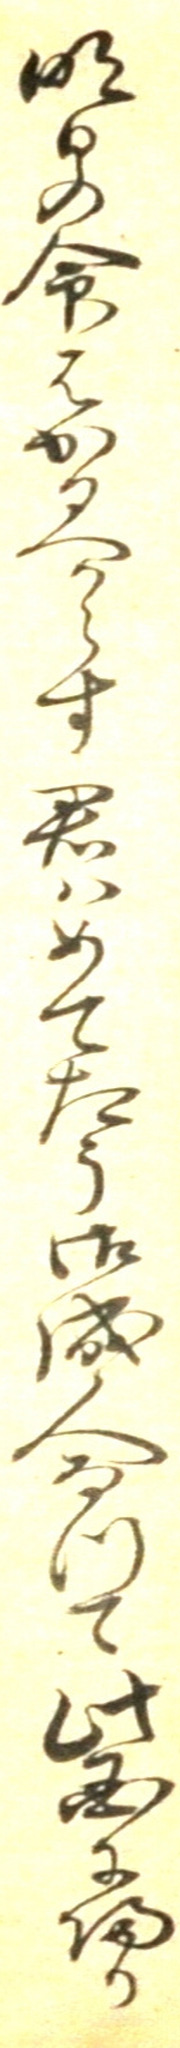明日の命はかるへからす君はめてたう御成人なつて此国に帰り
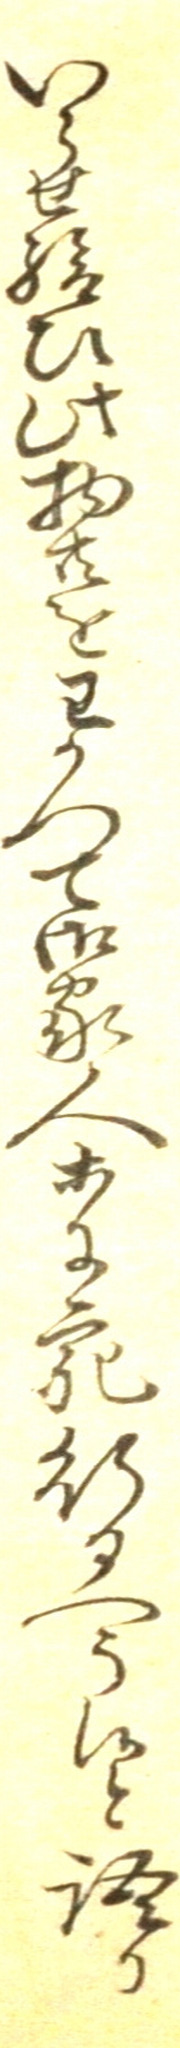いらせ給ひ此物共をわかつて御家人等に宛行るへう候と語り
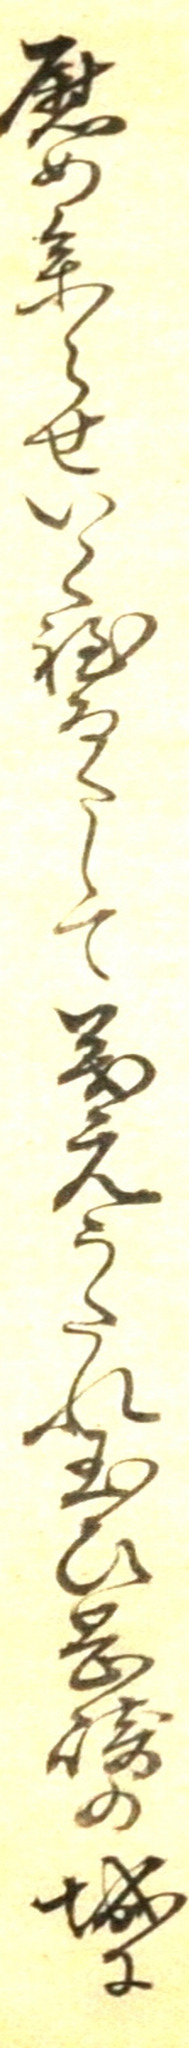慰め参らせいく程なくして義元うたれ玉ひ岡崎の城に
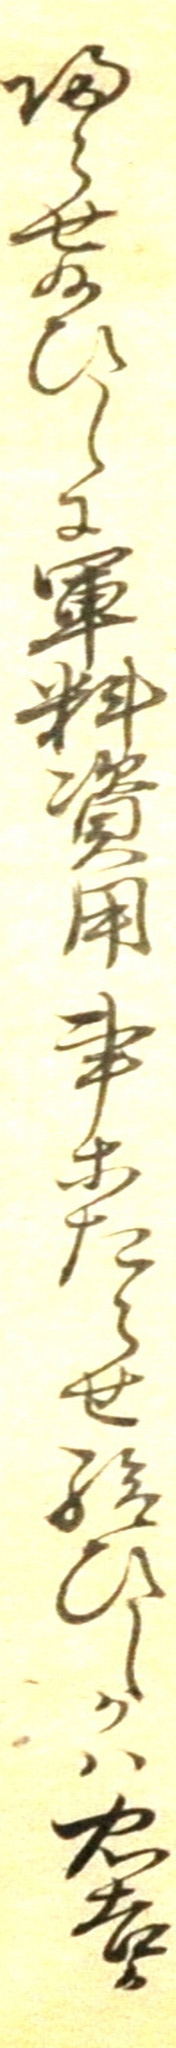帰らせ給ひしに軍料資用事等たらせ給ひしかは忠吉か
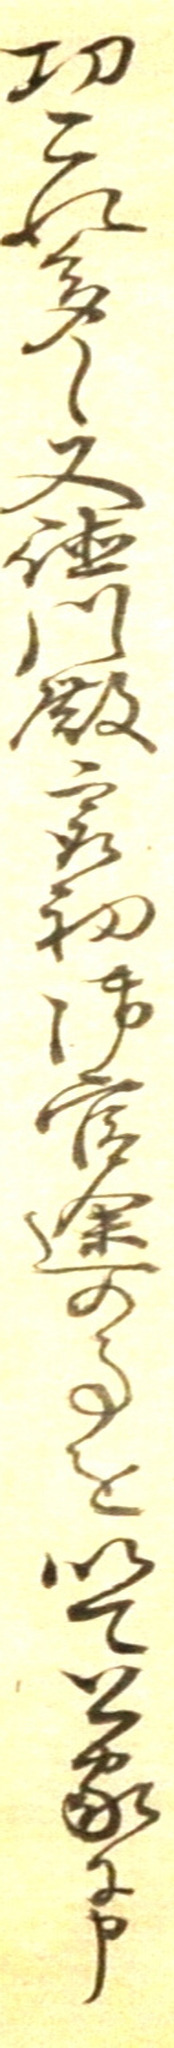功これ多し又徳川殿最初御官途の事を以て公家に申
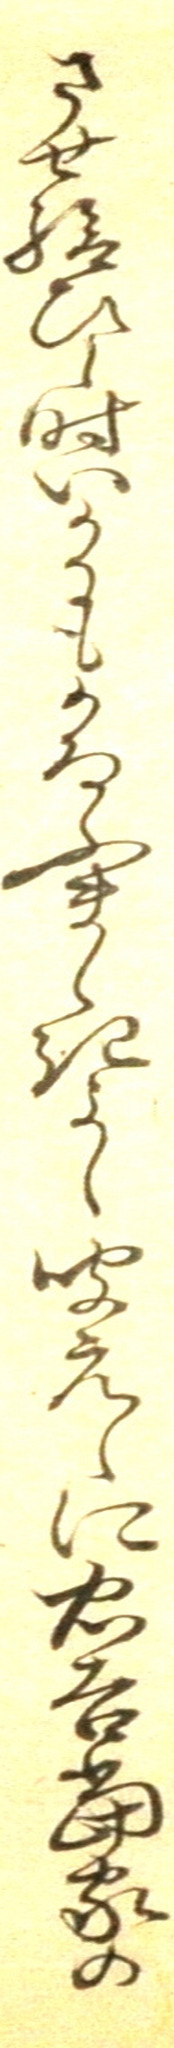させ給ひし時いかにもかなふましきよし聞えしに忠吉当家の
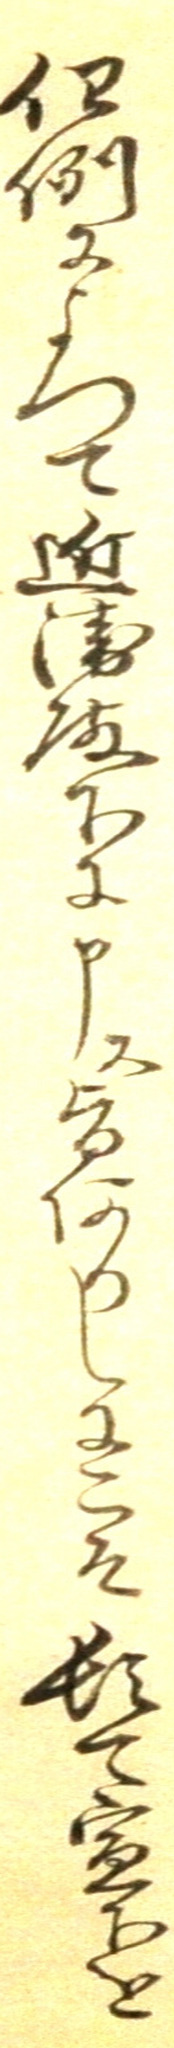任例によつて近衛殿下に申ス旨ありしにこそ頓て宣下を
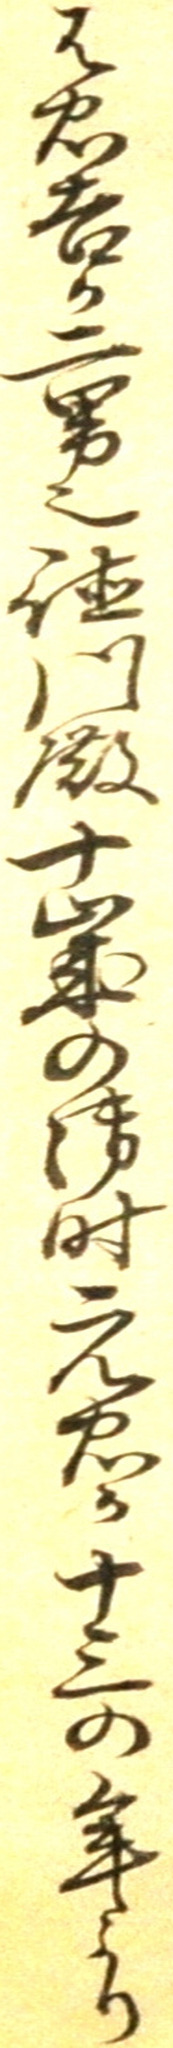は忠吉か二男也徳川殿十歳の御時元忠か十三の年より
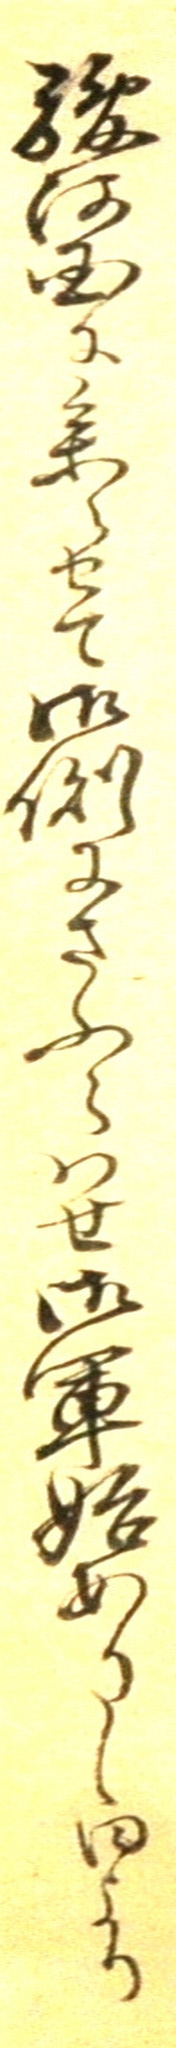駿河国に参らせて御側にさふらはせ御軍始ありし日より

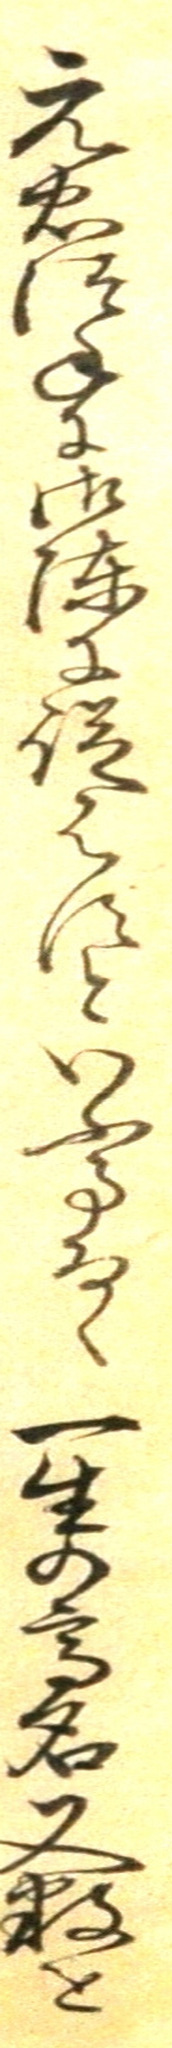元忠つねに御陣に従はすといふ事なく一生の高名又数を
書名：藩翰譜（四・中）
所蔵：伊那市立高遠町図書館・合同会社AMANE
